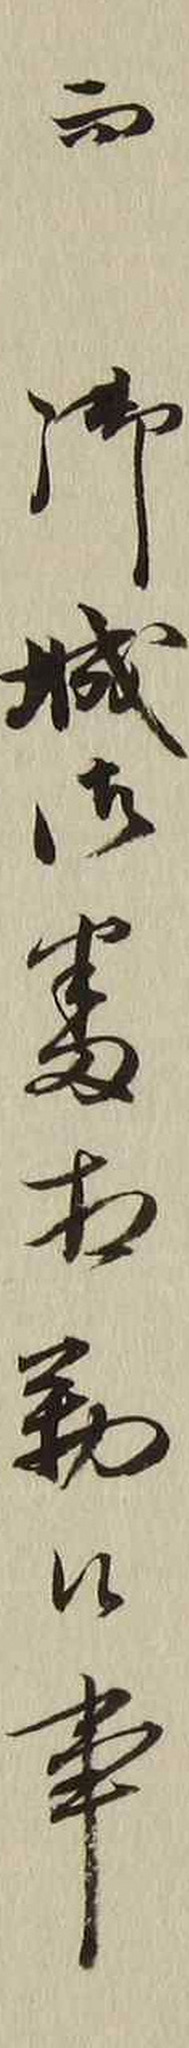而御城御番相勤候事
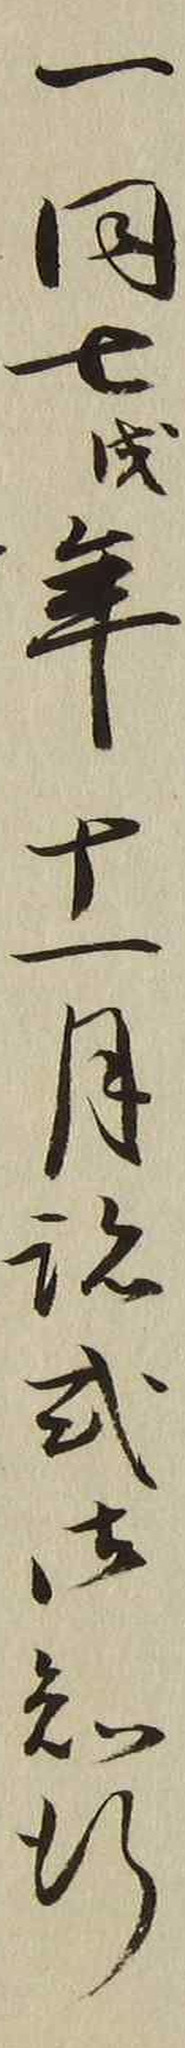一同七戌年十一月跡式御知行
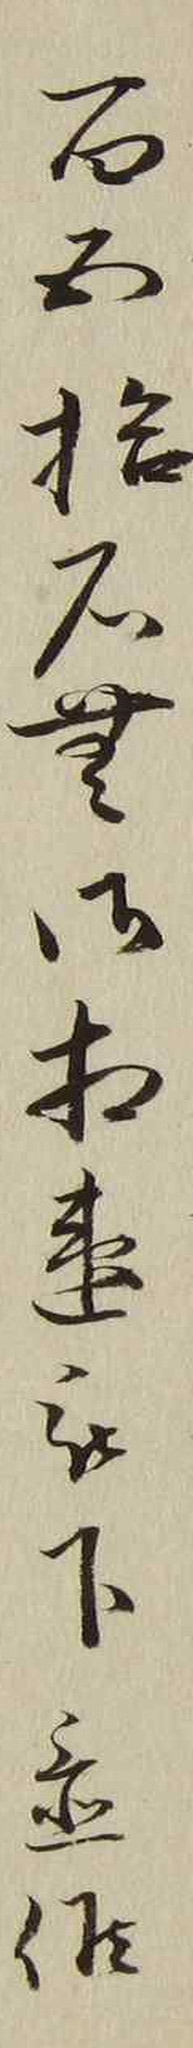百五拾石無御相違被下置候

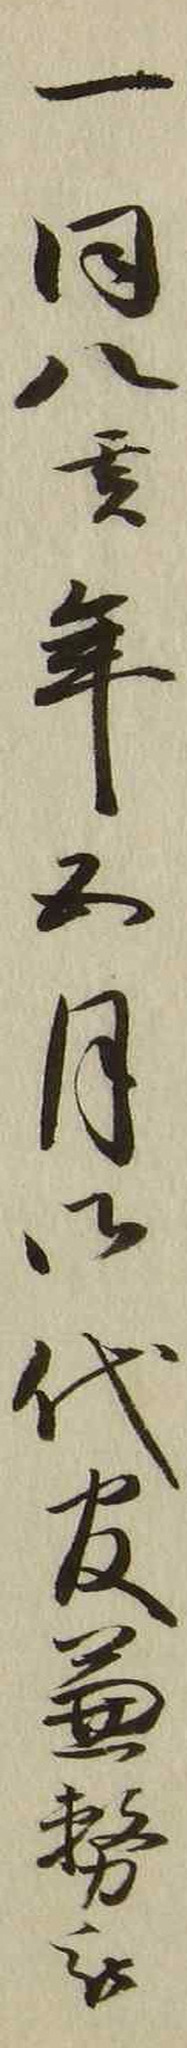一同八亥年五月御代官兼務被
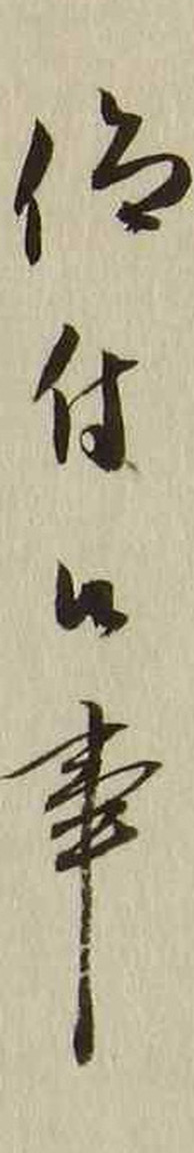仰付候事
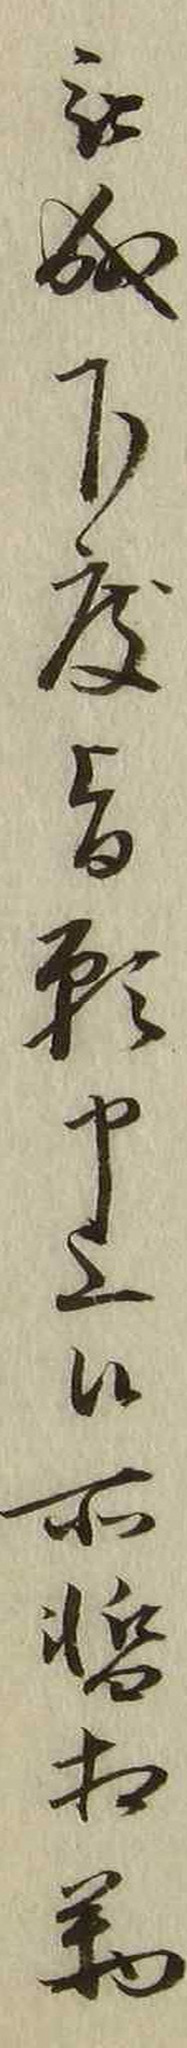被成下度旨願申上候所暫相勤
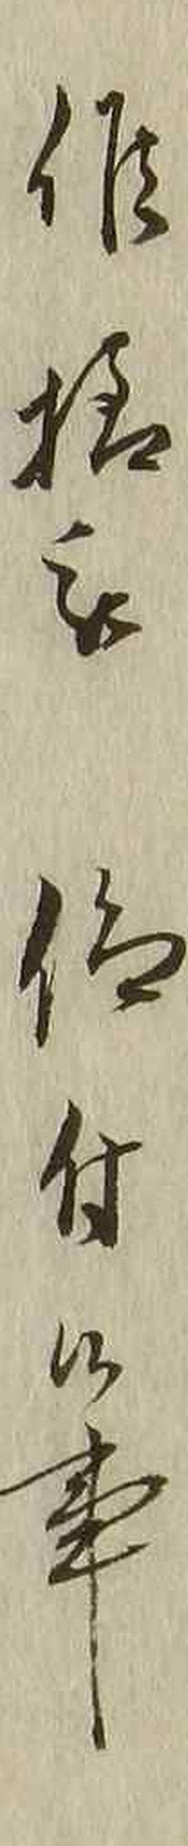候様被仰付候事
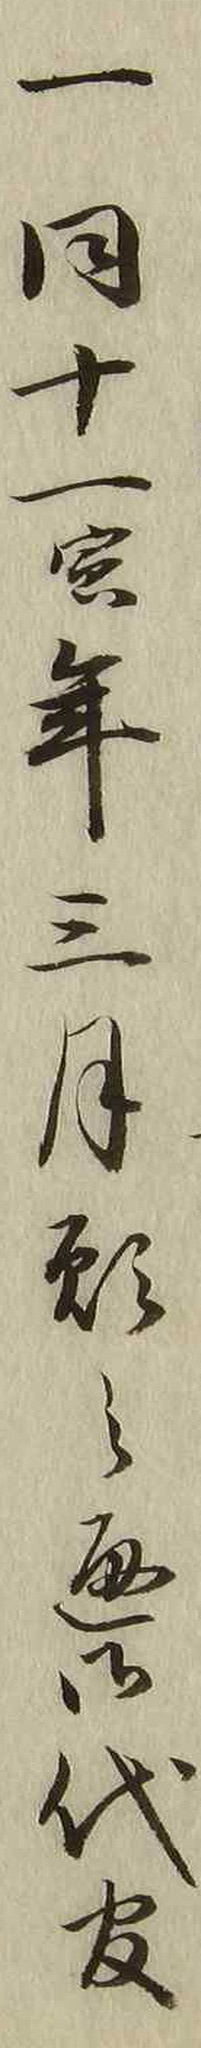一同十一寅年三月願之通御代官
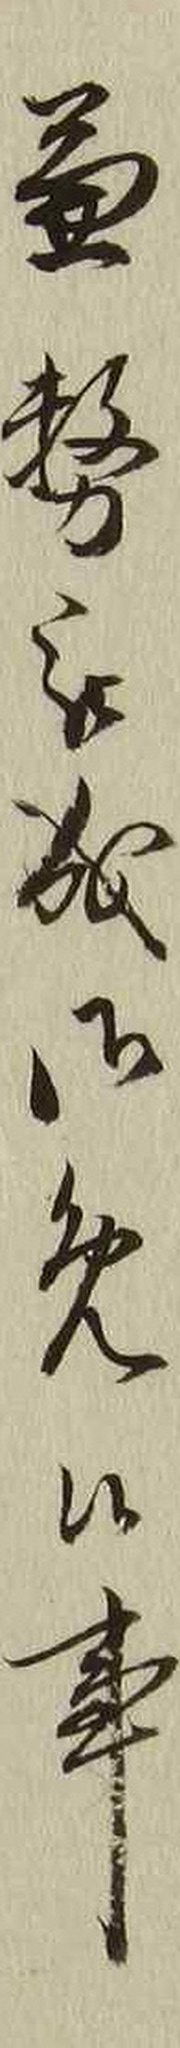兼務被成御免候事
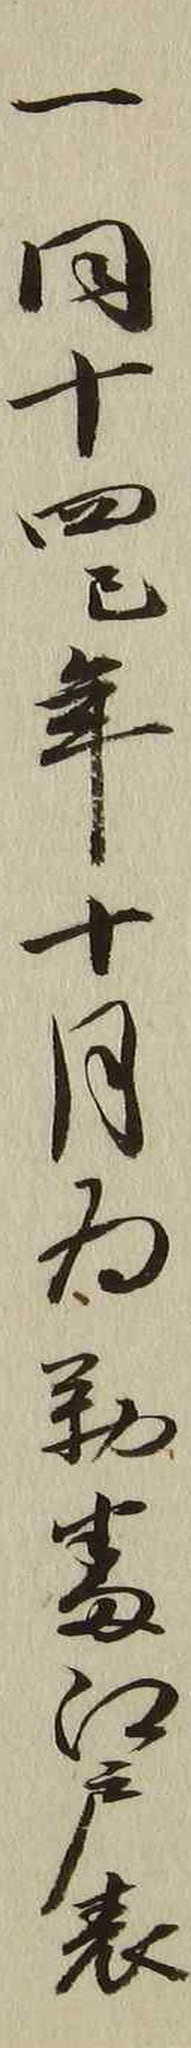一同十四巳年十月為勤番江戸表
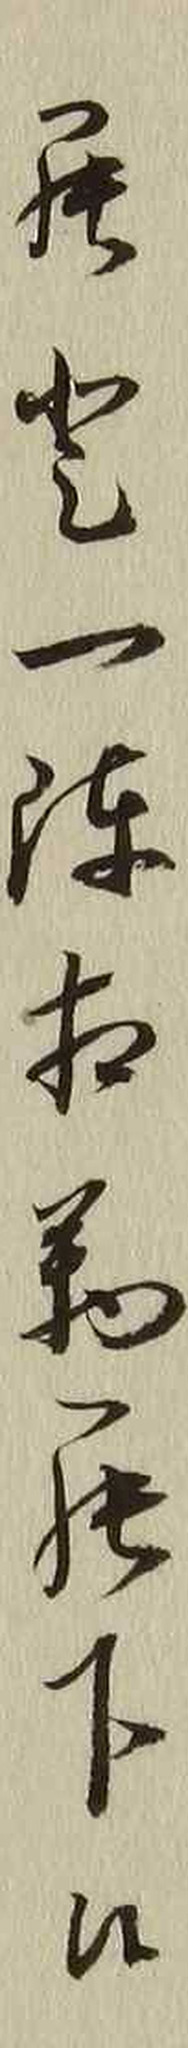罷登一陣相勤罷下候
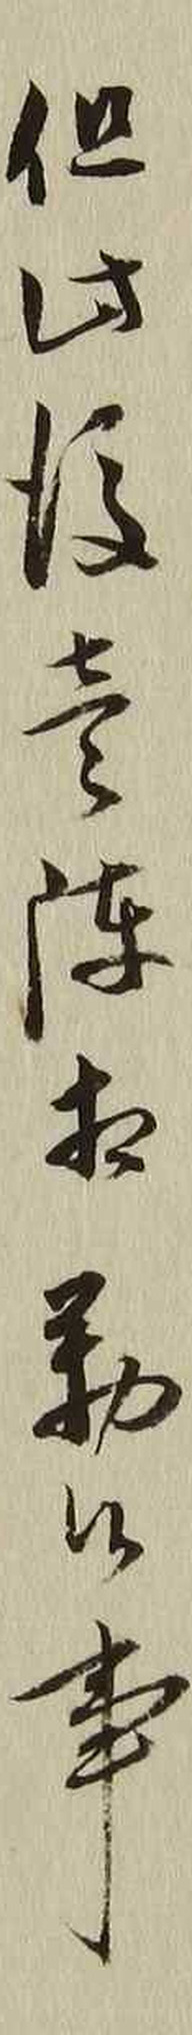但此後壱陣相勤候事
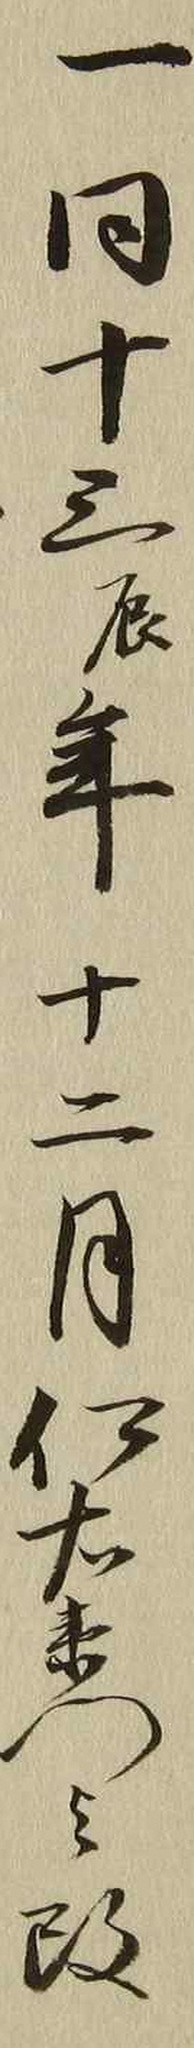一同十三辰年十二月伊右衛門与改
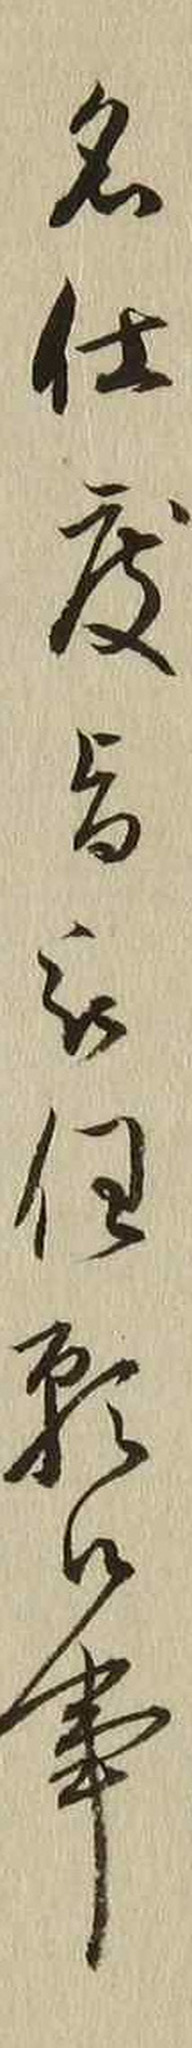名仕度旨被任願候事
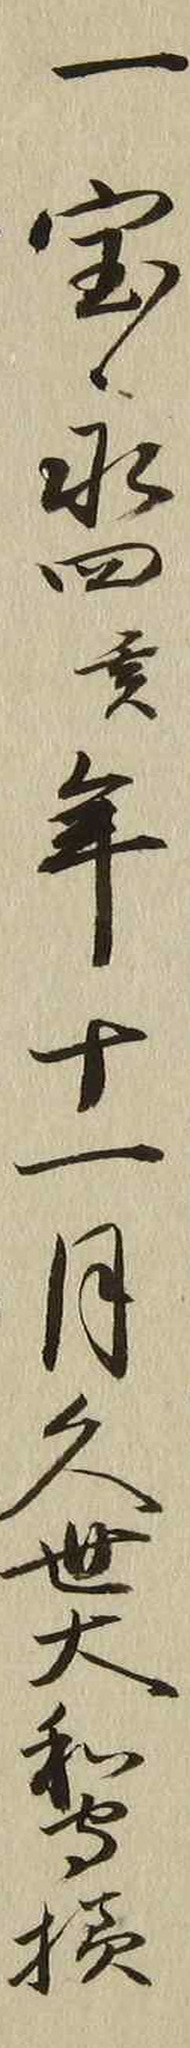一宝永四亥年十一月久世大和守様
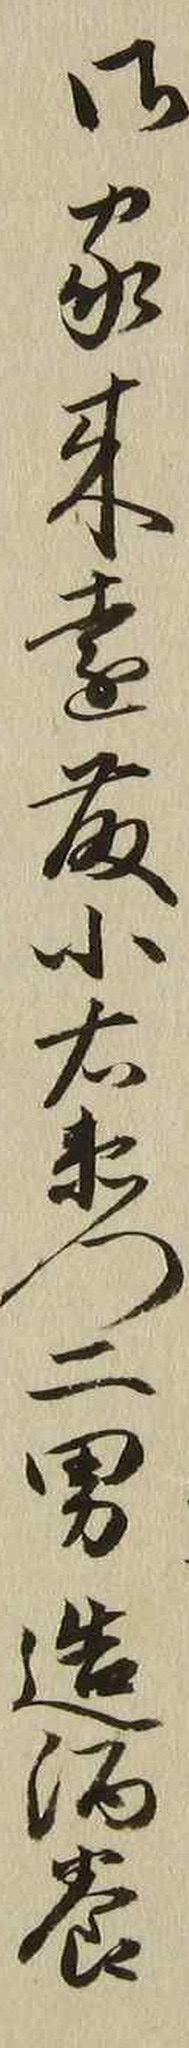御家来遠藤小右衛門二男造酒養
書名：諸士系譜　巻之61　と之部4
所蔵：会津若松市立会津図書館
